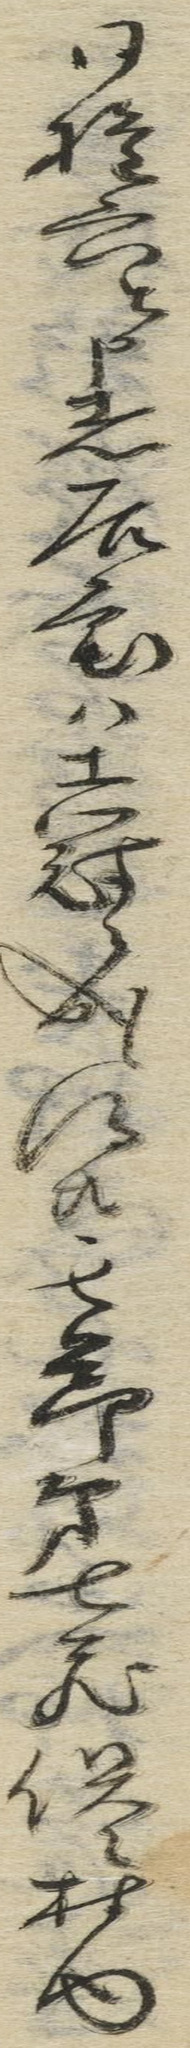一同権六と申者居宅ハ土冠二成候得共其節弟七蔵俣々村内
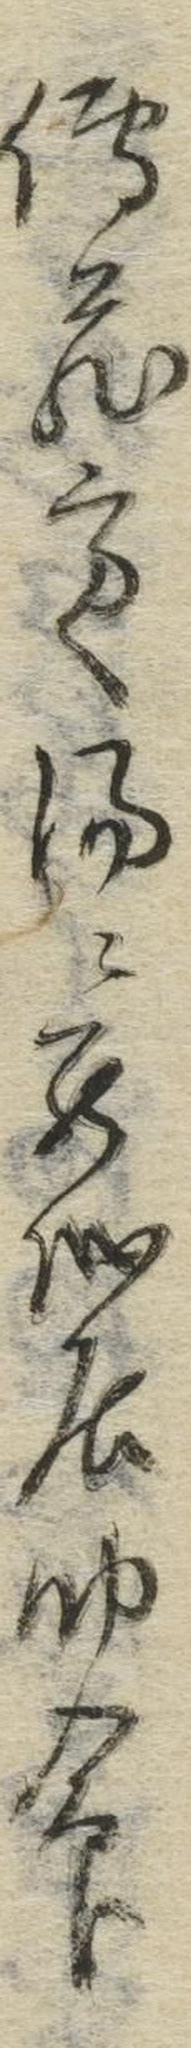伝蔵方へ湯二罷越居助命
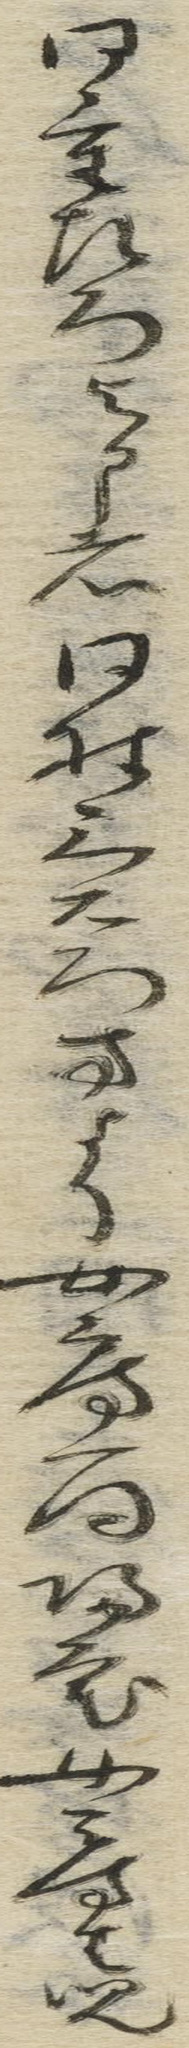一同重左衛門と申者同村三右衛門方より女房一同帰宅女房は児
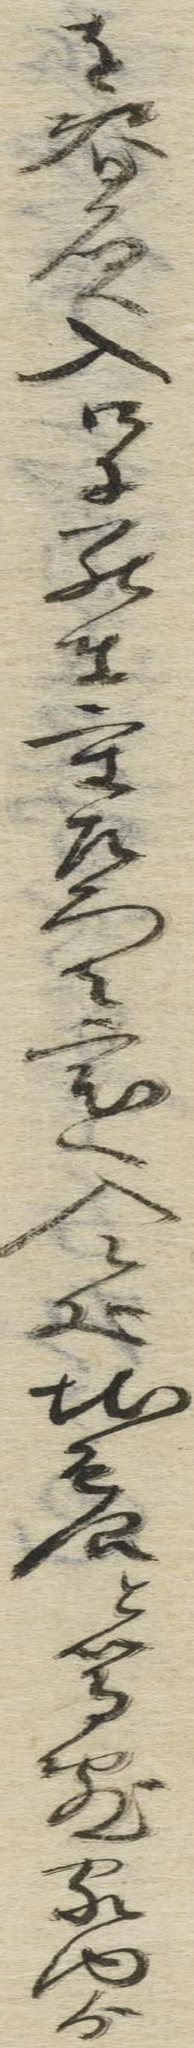を背負入口に罷在重左衛門は室へ入候処地震と等敷家内ゟ
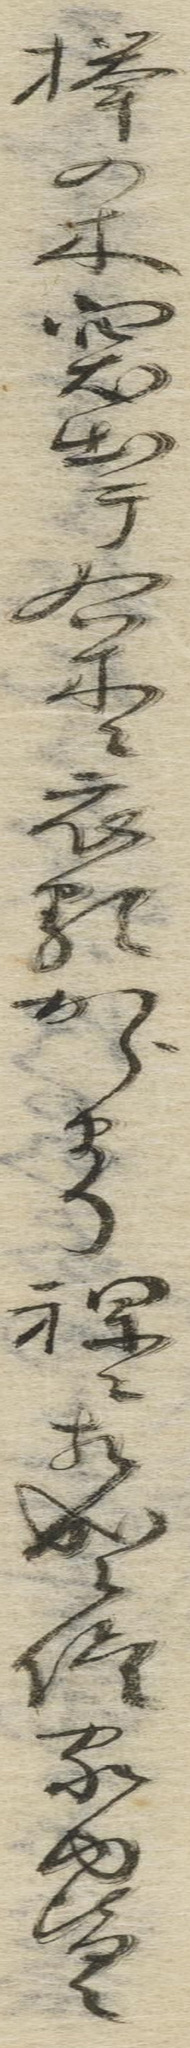欅の木突出テ右木二衣類からまり裸二相成候儘家内皆々
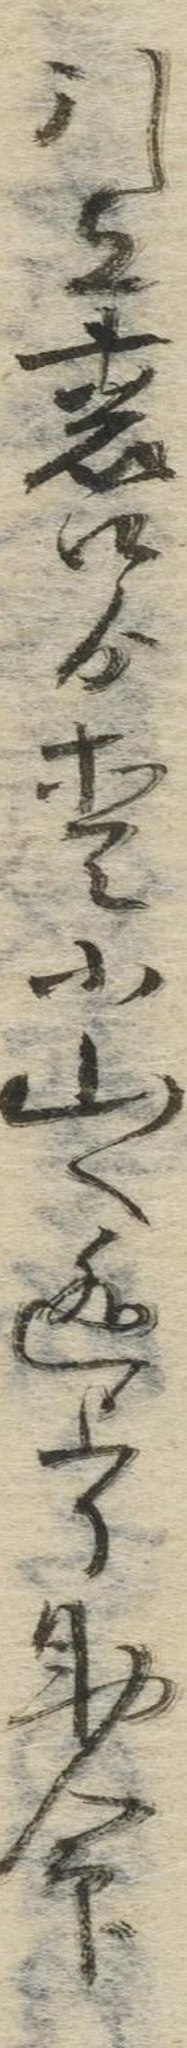引立裏口ゟ登小山へ逃上り助命
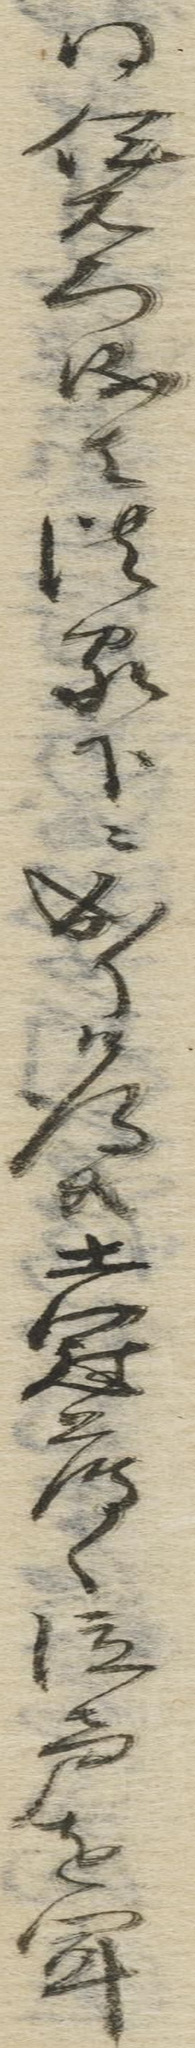一同伊右衛門儀は潰家下二成り候得共土冠薄く泣声を聞
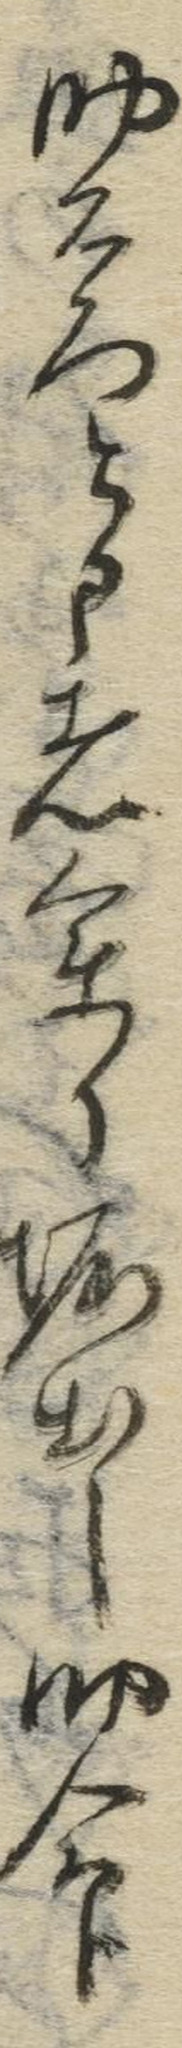助右衛門と申者参り掘出し助命
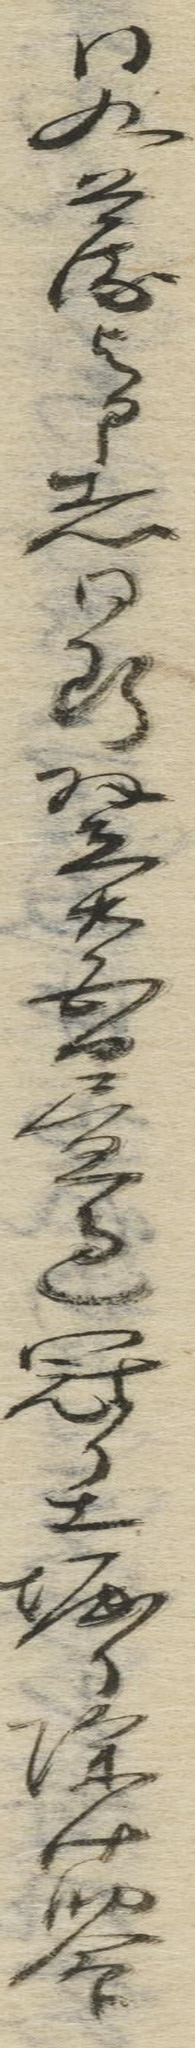一同九兵衛と申者同断翌廿五日昼過迄冠り土堀り除け助命
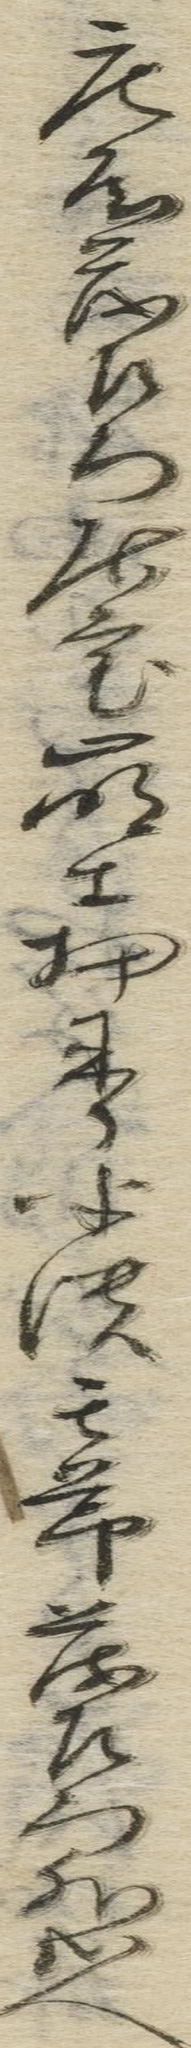一庄屋茂左衛門居宅崩土押来り半潰其節茂左衛門外弐人
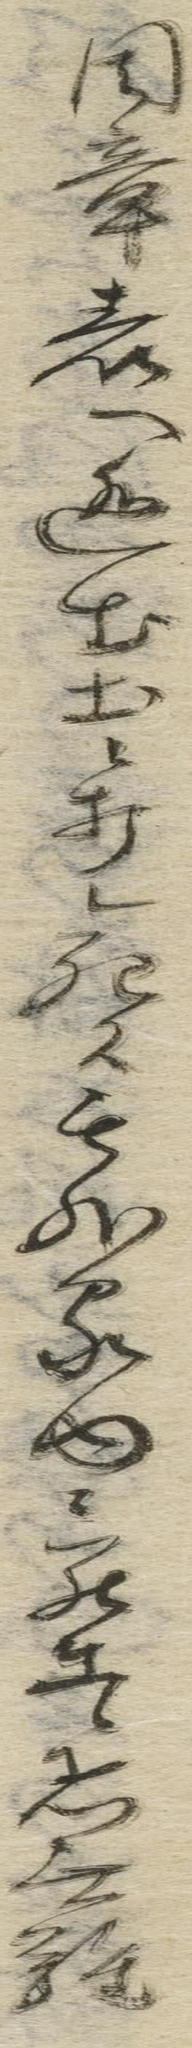周章表へ逃出土二打レ死ス其外家内二罷在候者無難
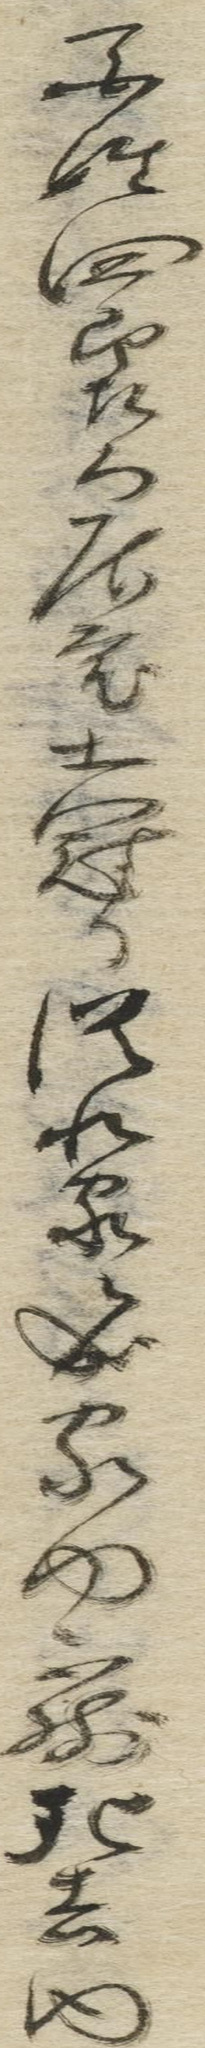一百姓四郎左衛門居宅土冠り潰れ家二成家内不残死去内
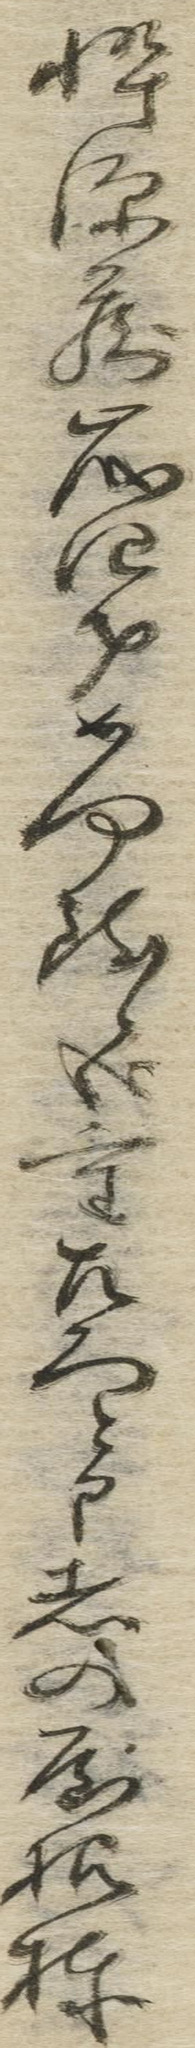忰源蔵歳四才如何致候哉重左衛門と申者の屋根棟
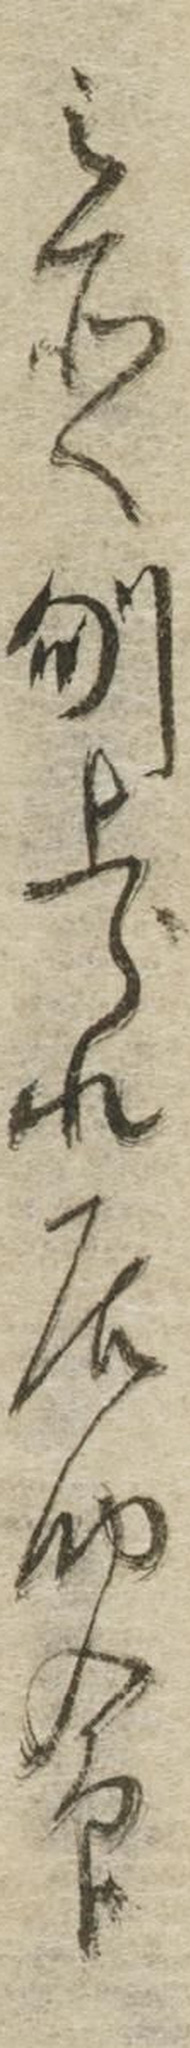之所へ刎上られ居助命
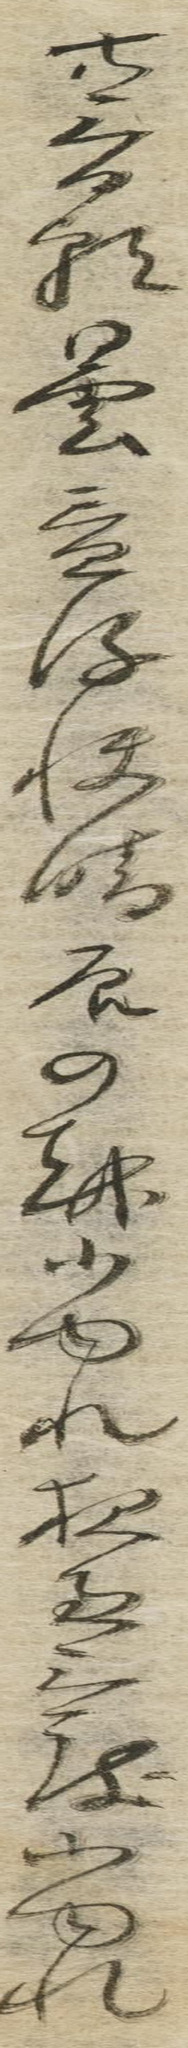廿三日朝曇昼後快晴辰の刻小ゆれ夜両三度小ゆれ
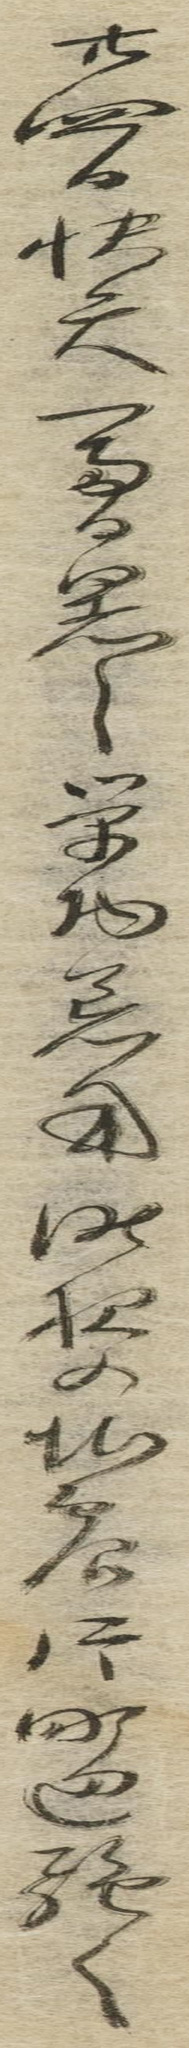廿四日快天一両日暑し単物着用此夜の地震片町辺強く
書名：弘化丁未天變日記
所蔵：東京大学地震研究所図書室 Earthquake Research Institute Library, The University of Tokyo, JAPAN
